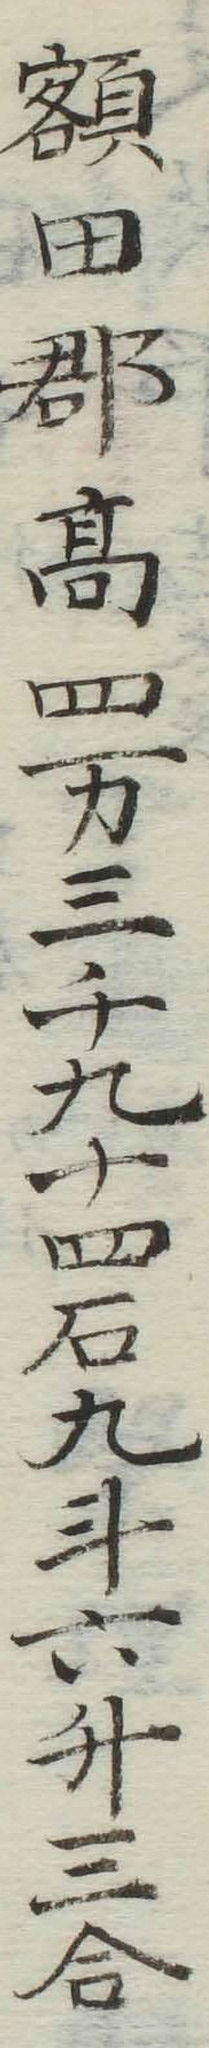額田郡髙四万三千九十四石九斗六升三合
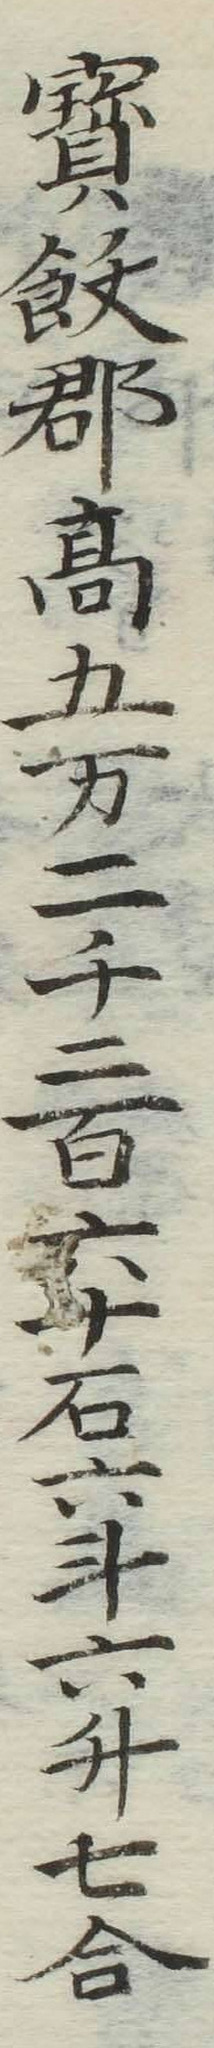寳飫郡髙五万二千二百六十石六斗六升七合
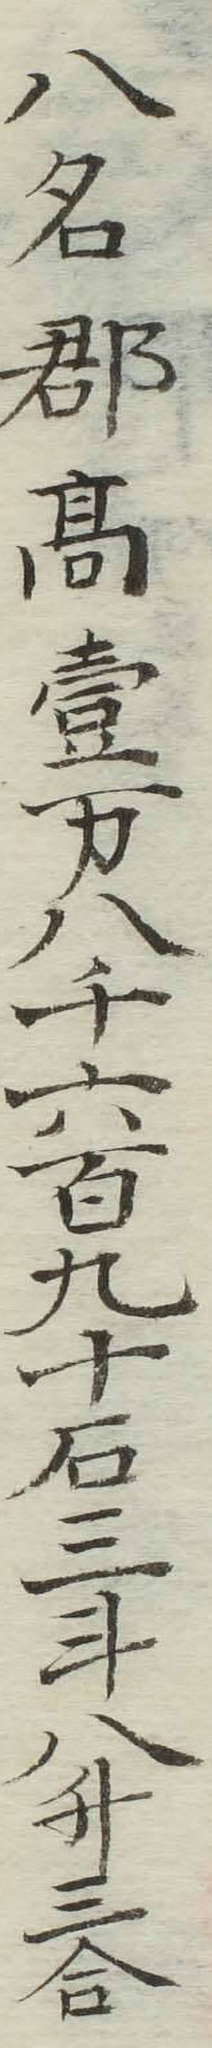八名郡髙壹万八千六百九十石三斗八升三合
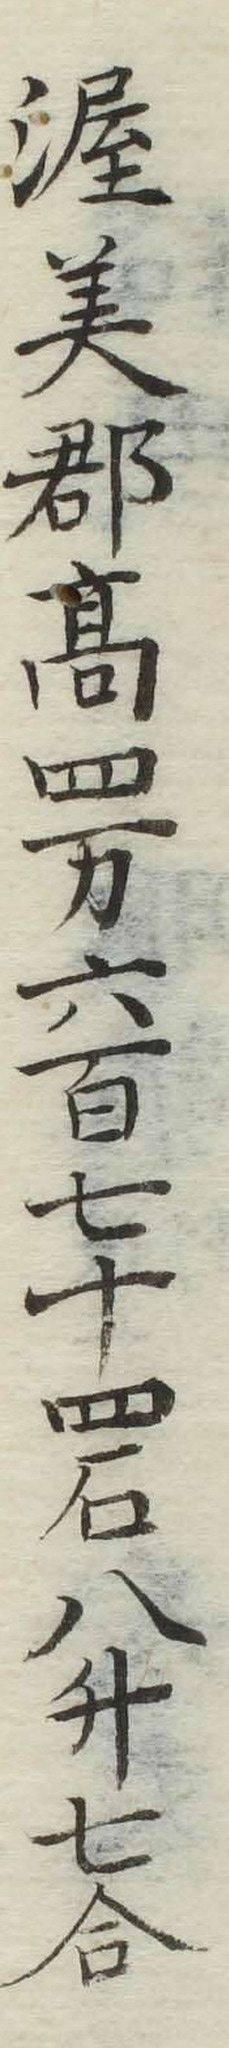渥美郡髙四万六百七十四石八升七合
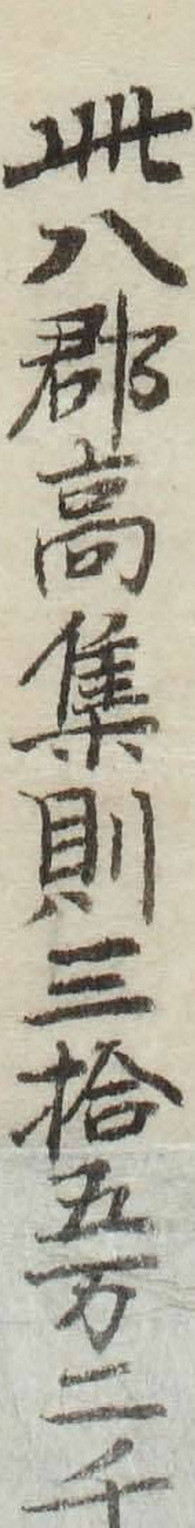此八郡高集則三拾五万二千
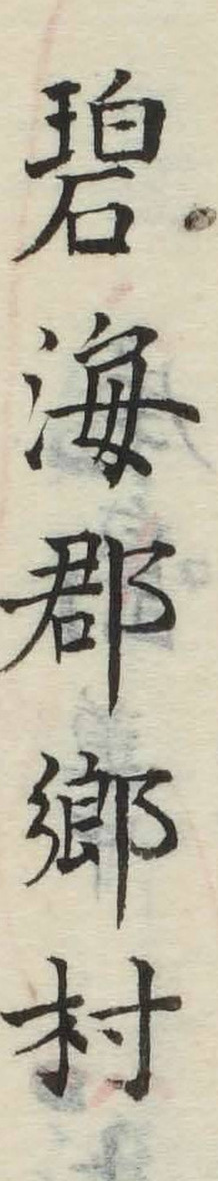碧海郡郷村

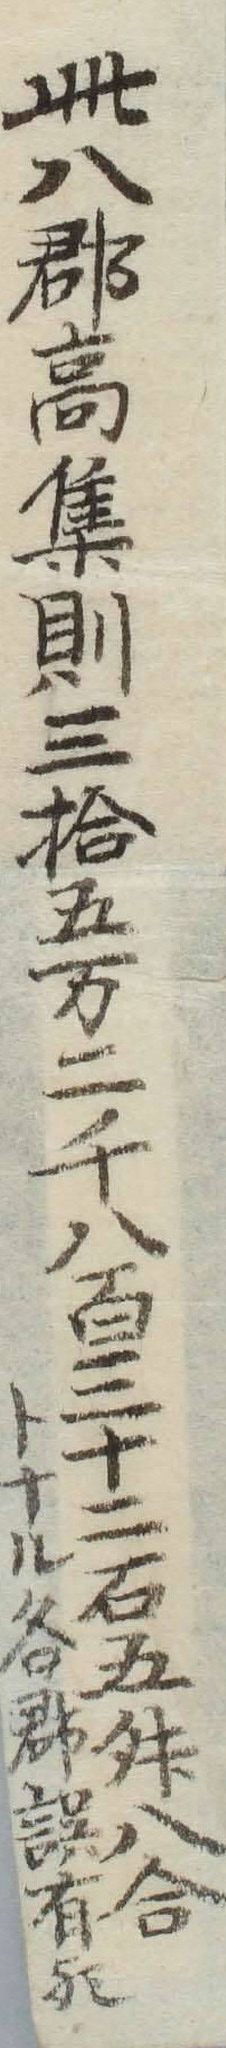此八郡高集則三拾五万二千八百三十二石五升八合

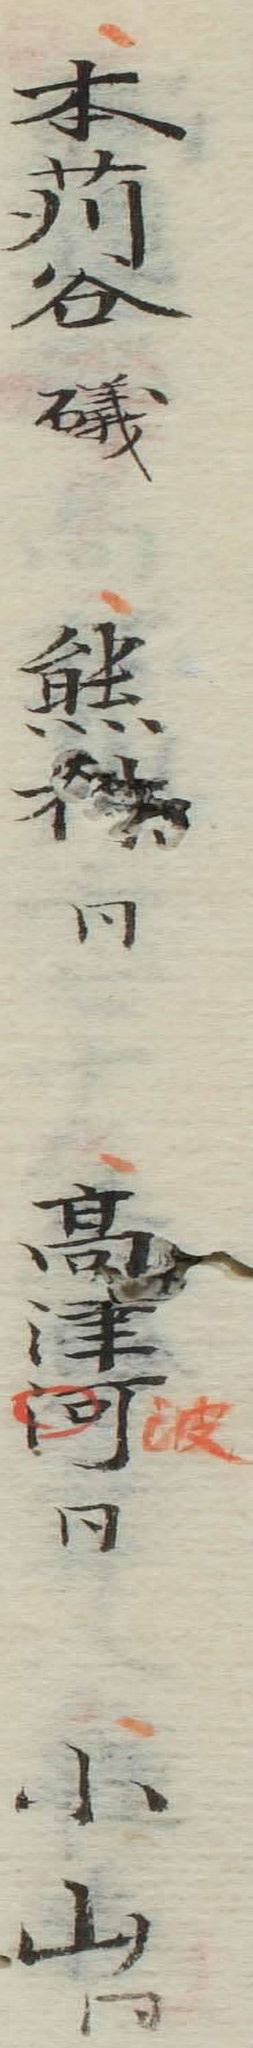本苅谷礒熊村同髙津河波同小山同

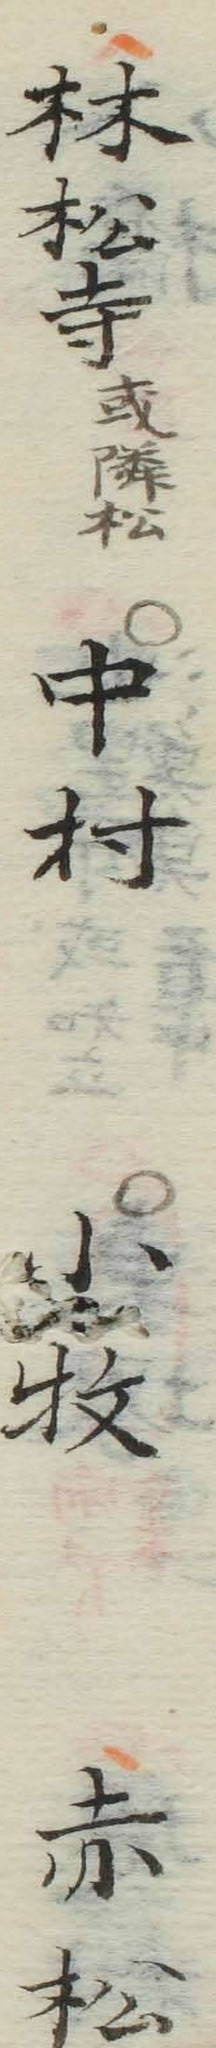林松寺或隣松○中村○小牧赤松
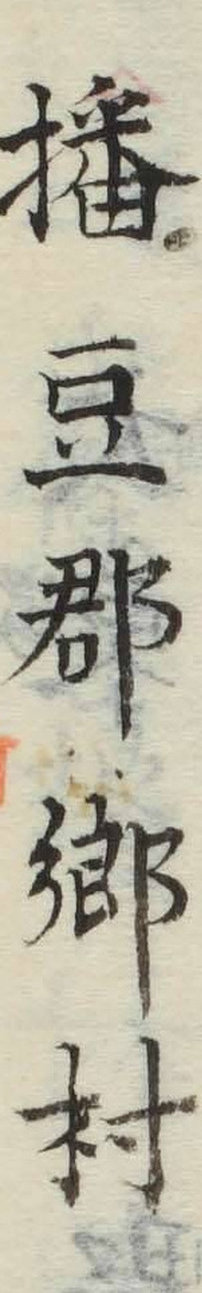播豆郡郷村
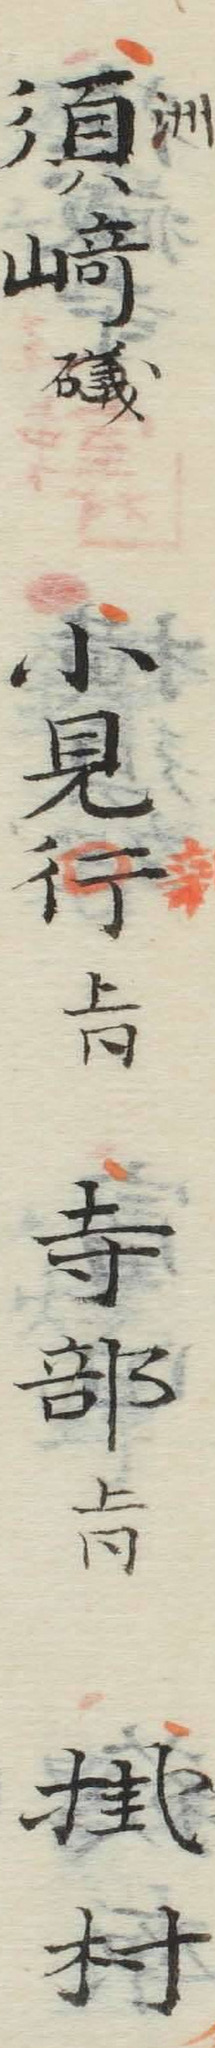須﨑礒小見行新上同寺部上同掛村
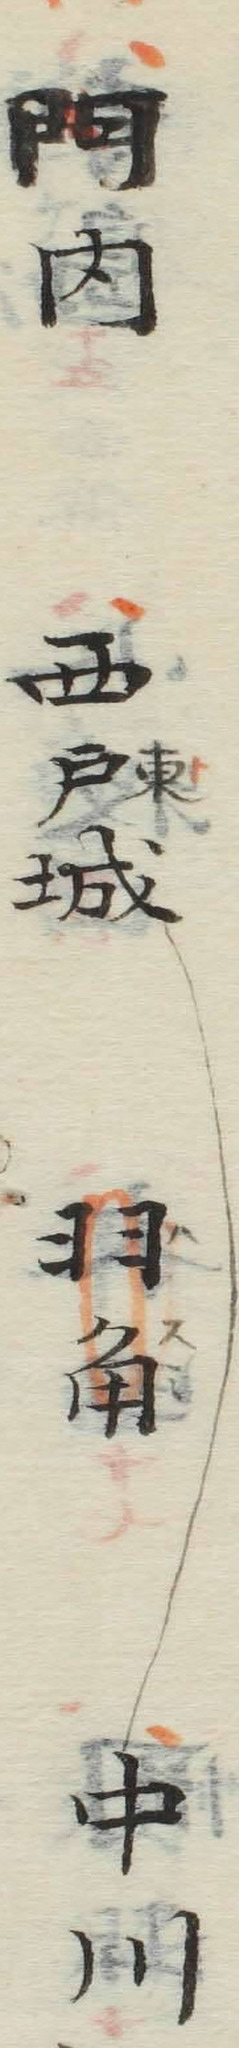門門内西戸城羽角中川
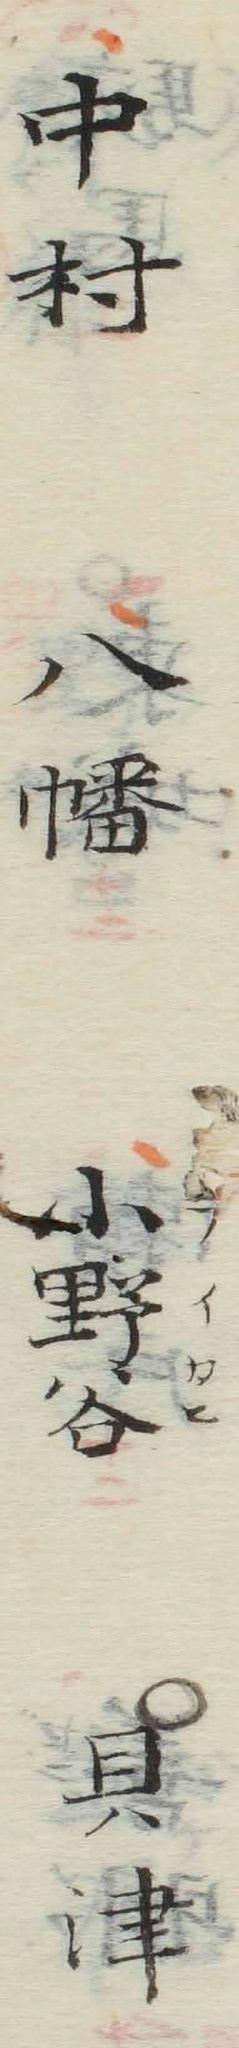中村八幡小野谷○貝津
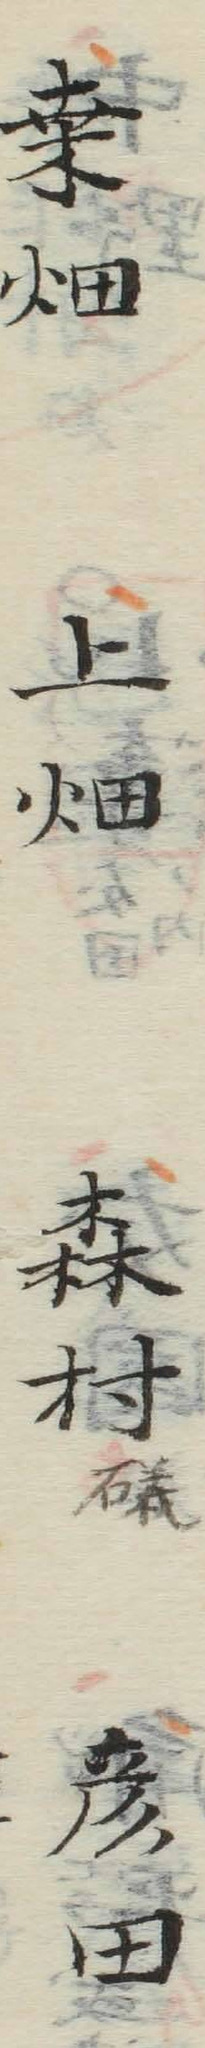桒畑上畑森村礒彦田
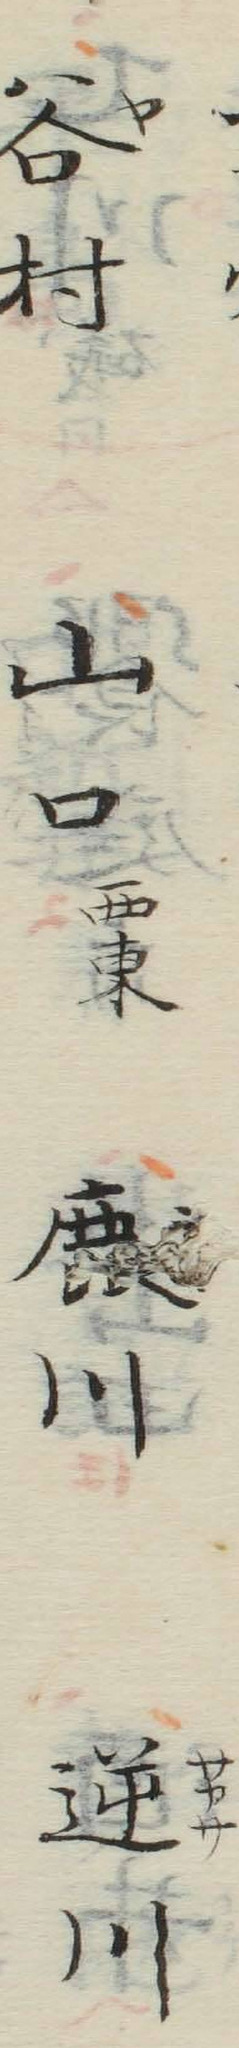谷村山口西東鹿川逆川
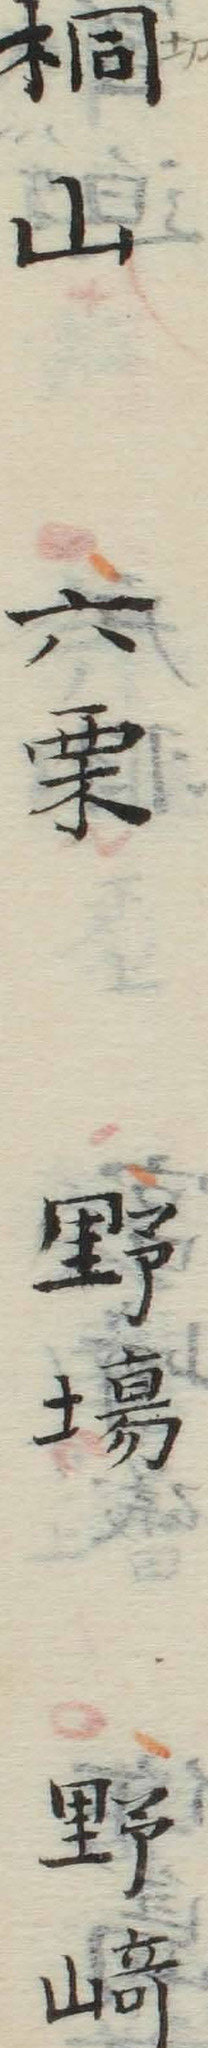桐山六栗野場野崎
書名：三河国二葉松
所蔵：国文学研究資料館
